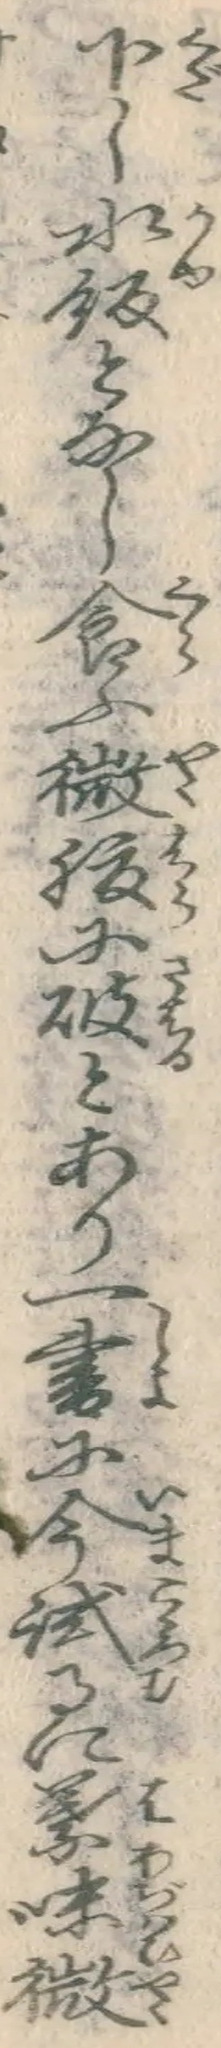下し水飯となし食ふ微腹に破とあり一書に今試るに葉味微
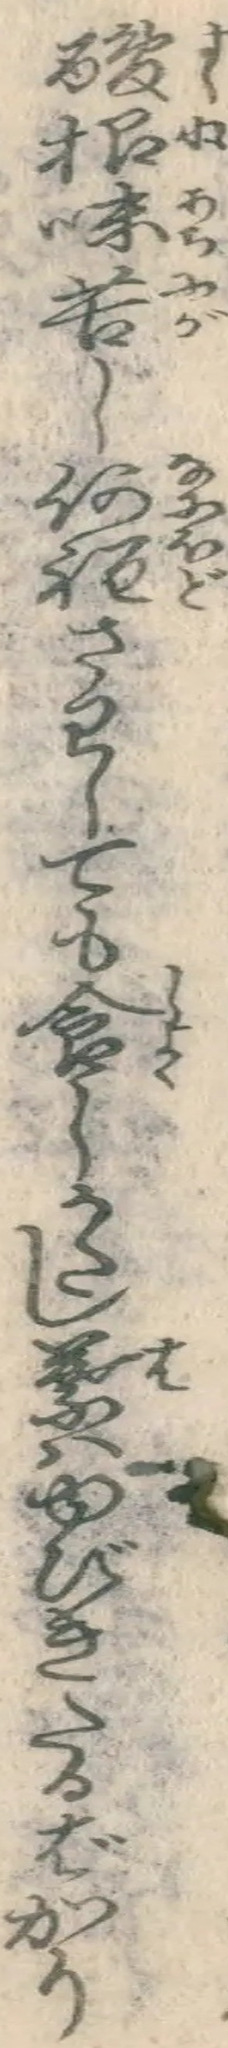酸根味苦し何程さわしても食しかたし葉はゆびきたるばかり
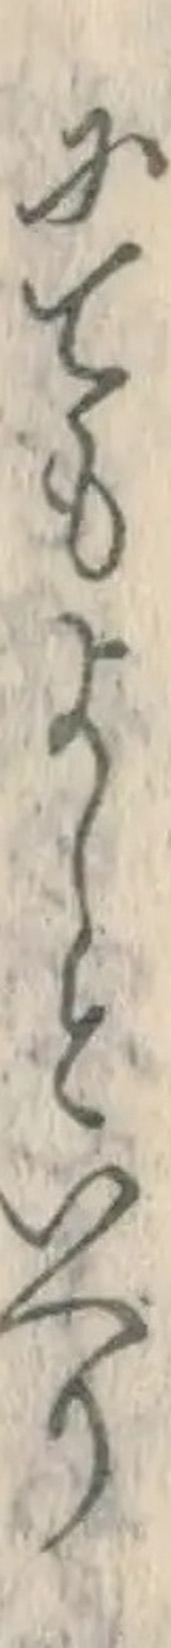にてもよしといへり
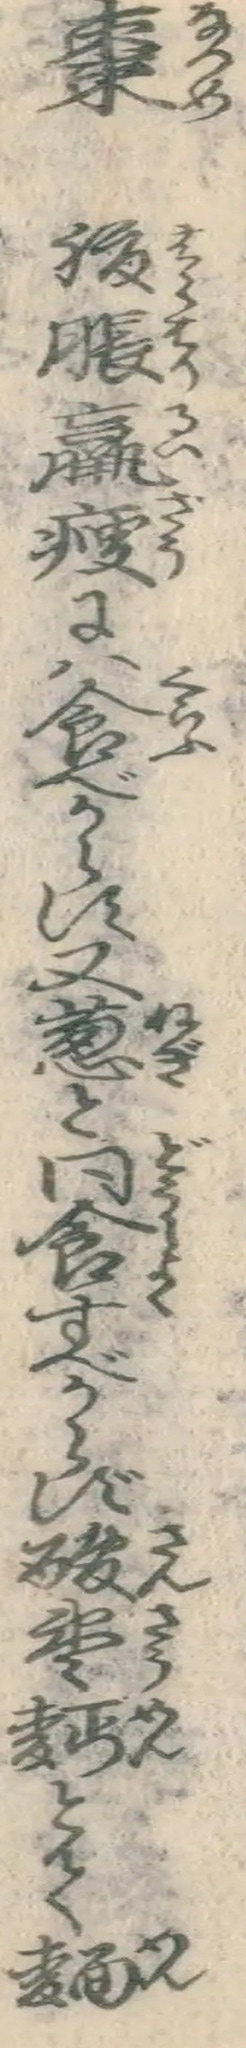棗腹脹羸痩には食べからす又葱と同食すべからず酸棗麪とて麺
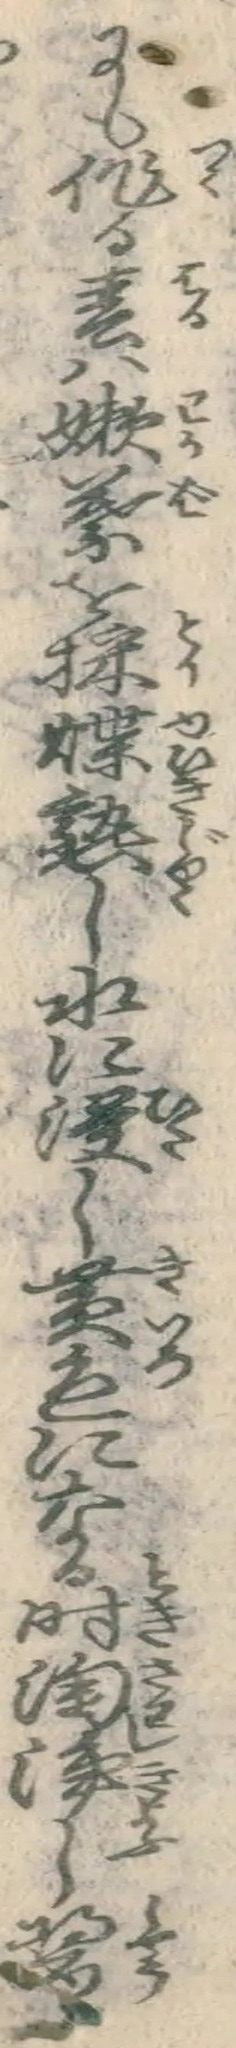にも作る春は嫰葉を採煠熟し水に浸し黄色になる時淘浄し醤
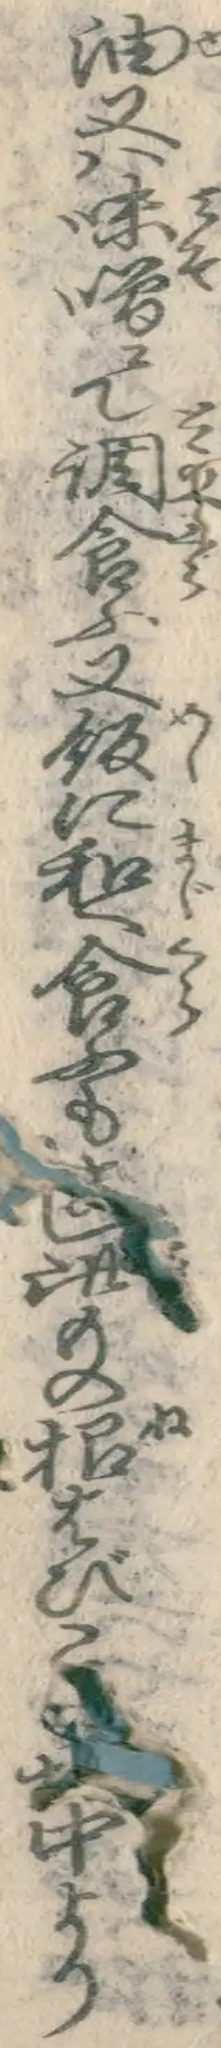油又は味噌にて調食ふ又飯に和へ食ふもよし此もの根はびこり地中より

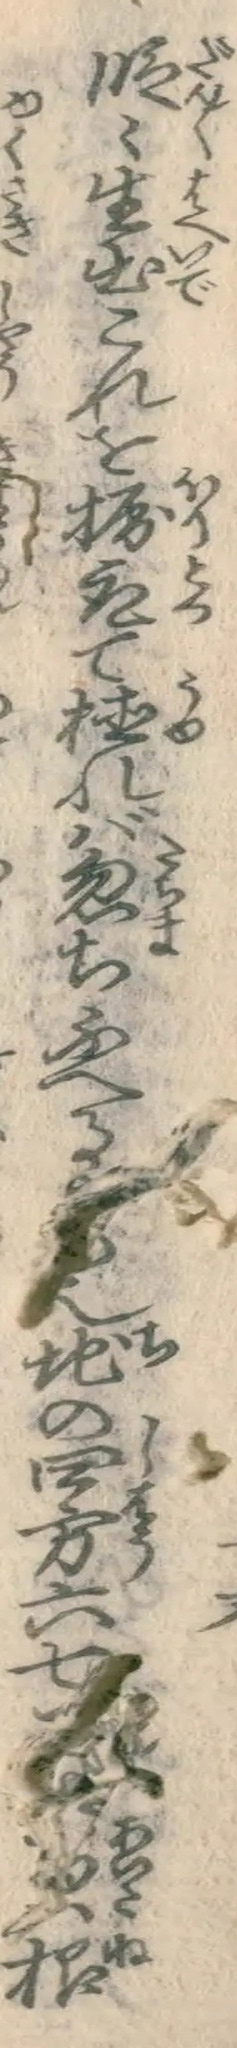段々生出これを堀取て植れば忽ちふへるもの也地の四方六七間が間は根
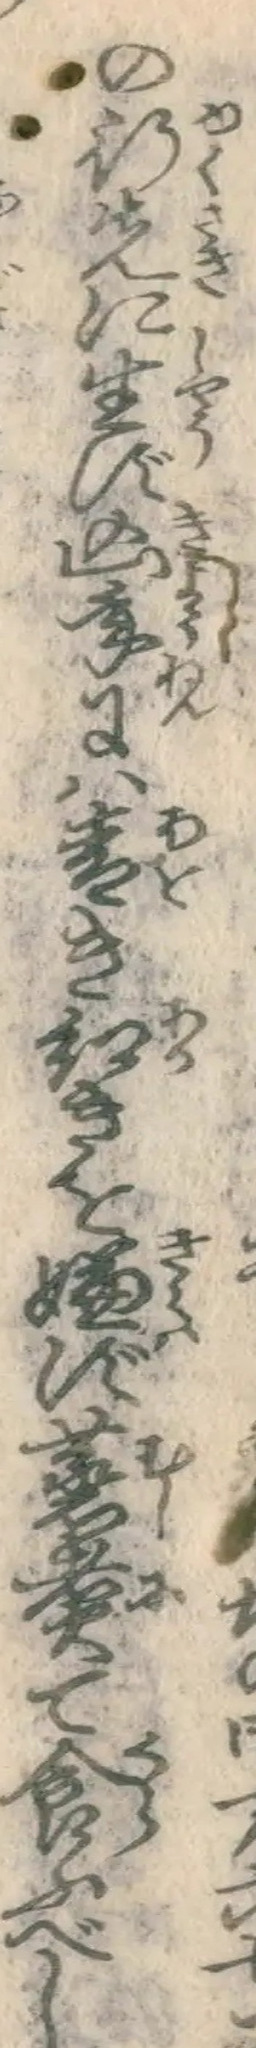の行先に生ず凶年には青き紅きを嫌ず蒸煑て食ふべし
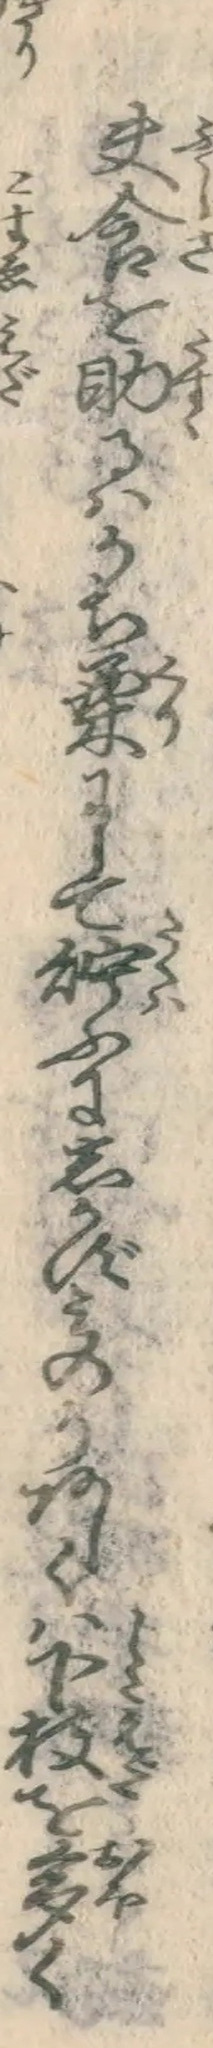栗夫食を助るはかち栗にして貯ふにしかずみのりあしくは下枝を多く
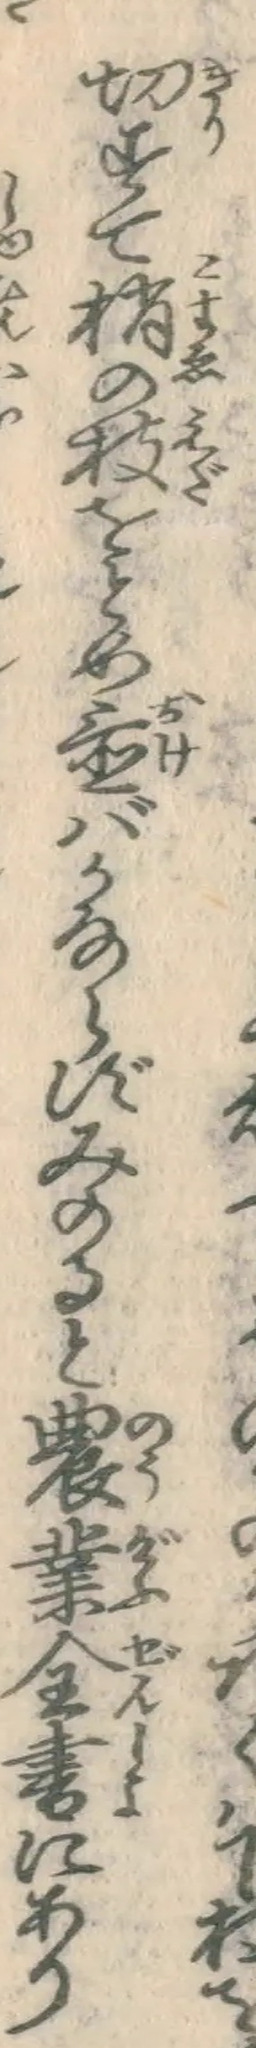切すて梢の枝をとめ置ばかならずみのると農業全書にあり
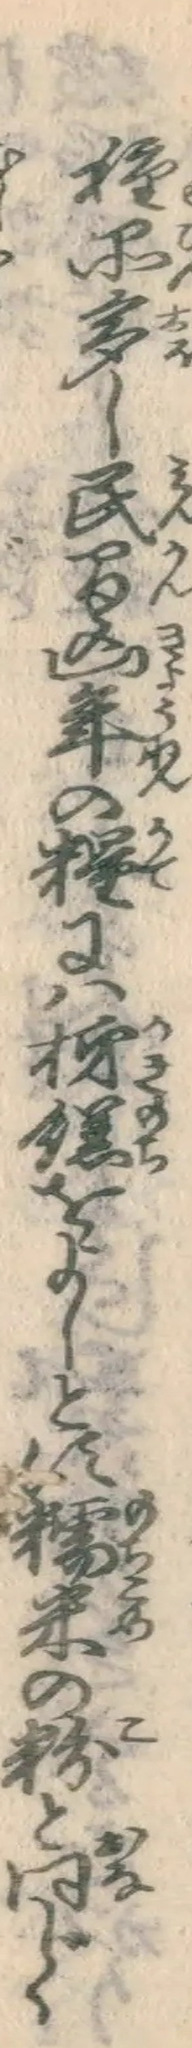柹種品多し民間凶年の糧には柹餅をよしとす糯米の粉と同じく
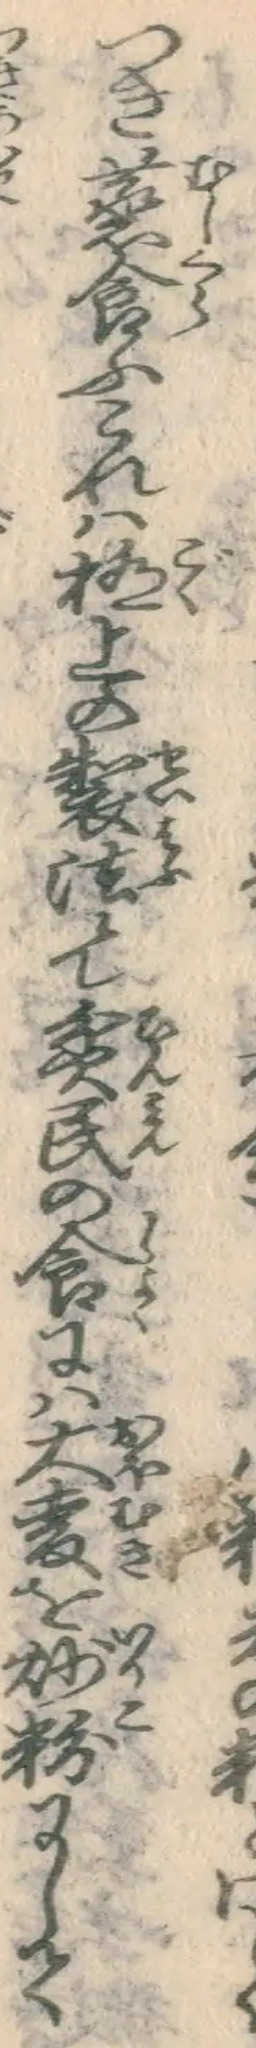つき蒸食ふこれは極上の製法にて貧民の食には大麦を炒粉にして
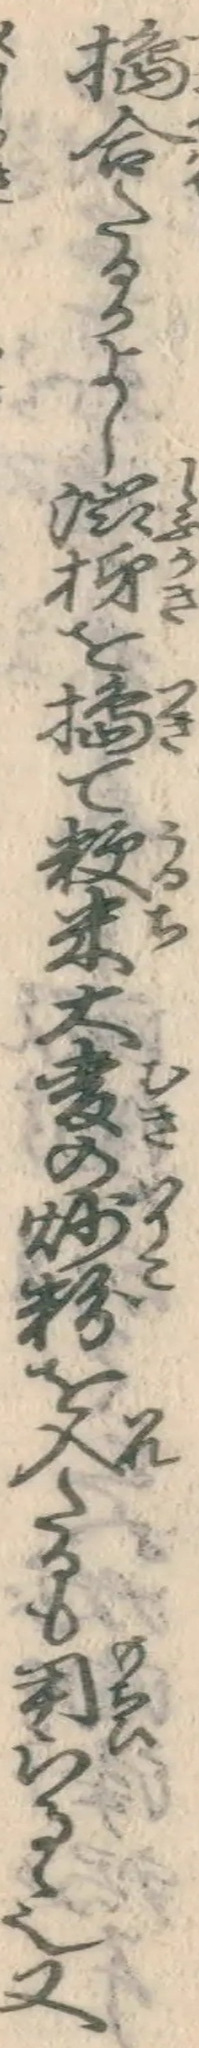搗合たるかよし渋柹を搗て粳米大麦の炒粉を入たるも用らるゝ也又
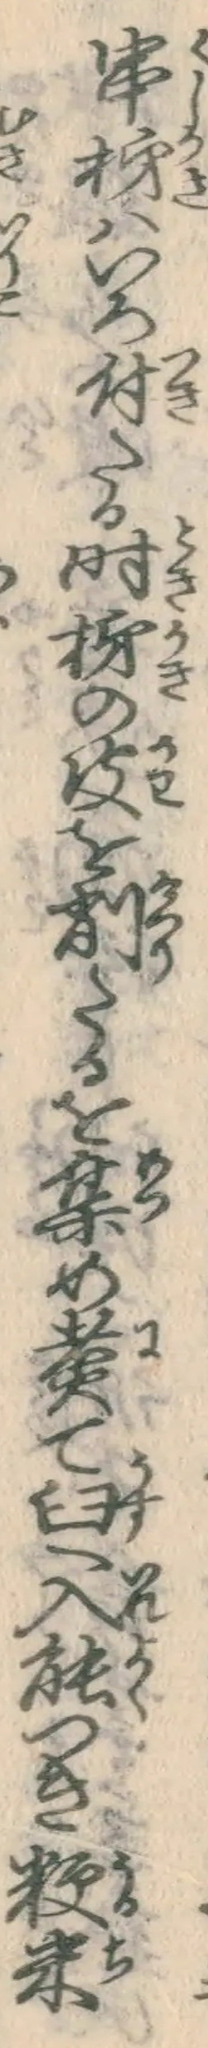串柹はいろ付たる時柹の皮を削たるを集め煑て臼へ入能つき粳米
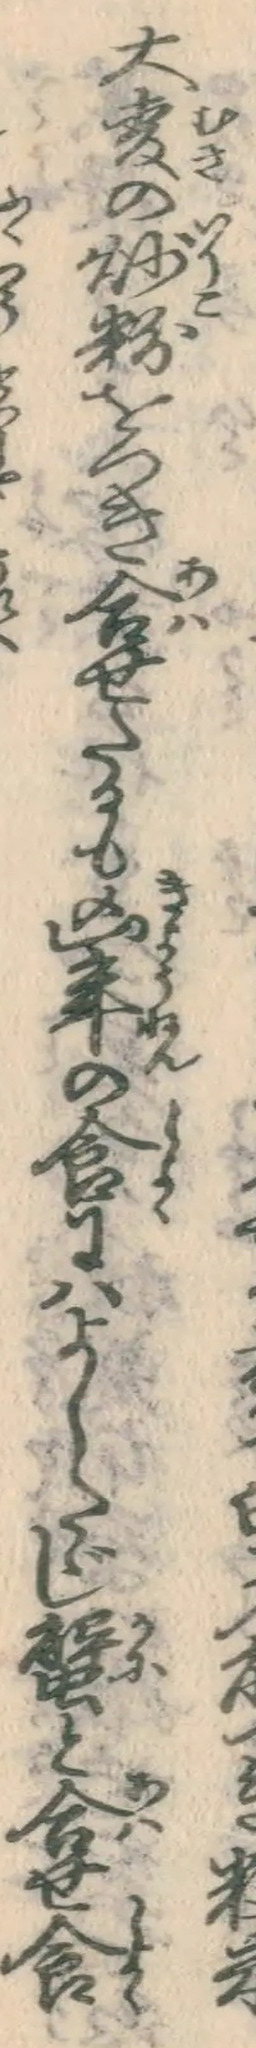大麦の炒粉をつき合せたるも凶年の食にはよしたゞし蟹と合せ食
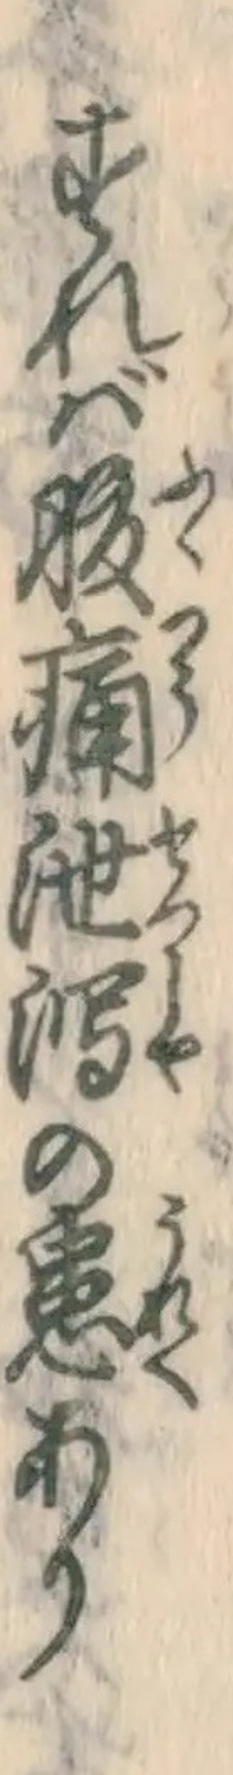すれば腹痛泄瀉の患あり
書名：経済をしへ草
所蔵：国立国会図書館 National Diet Library, JAPAN
